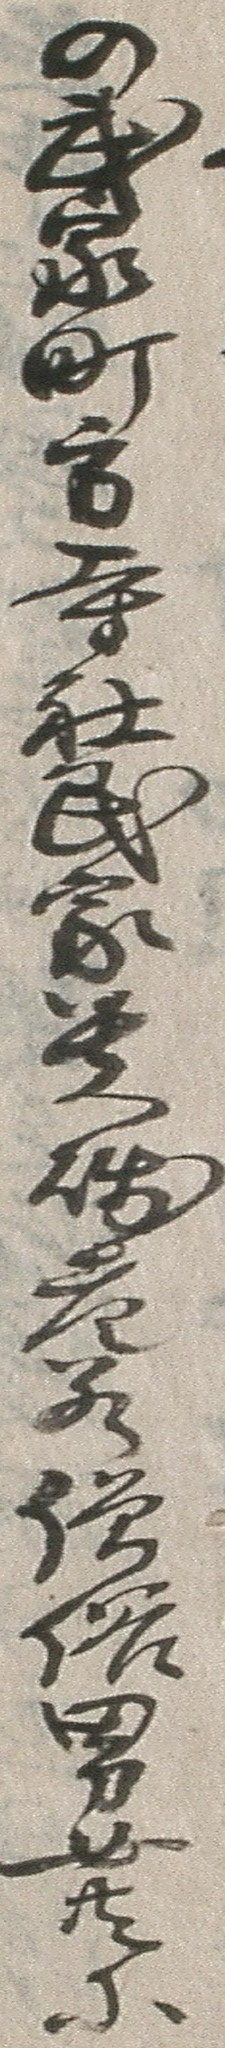の武家町方寺社民家貴賤老若僧俗男女共に
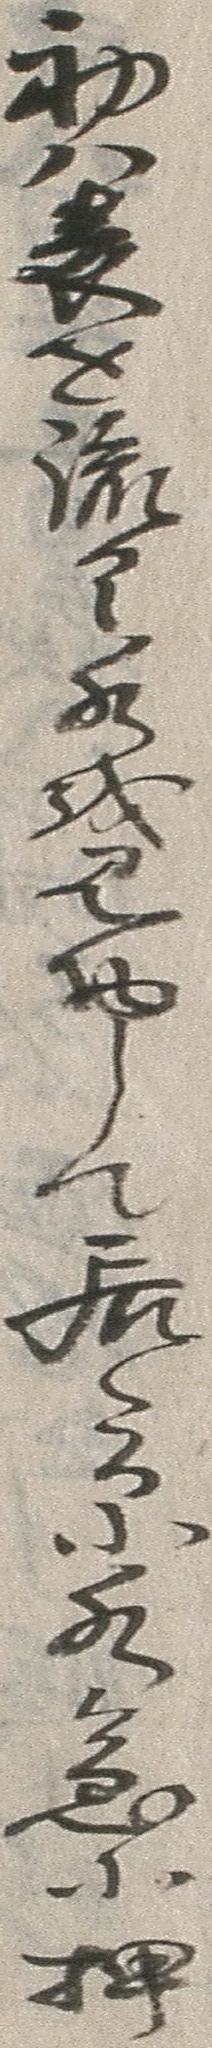初は表を流るゝ水を見物して居たるに水急に押
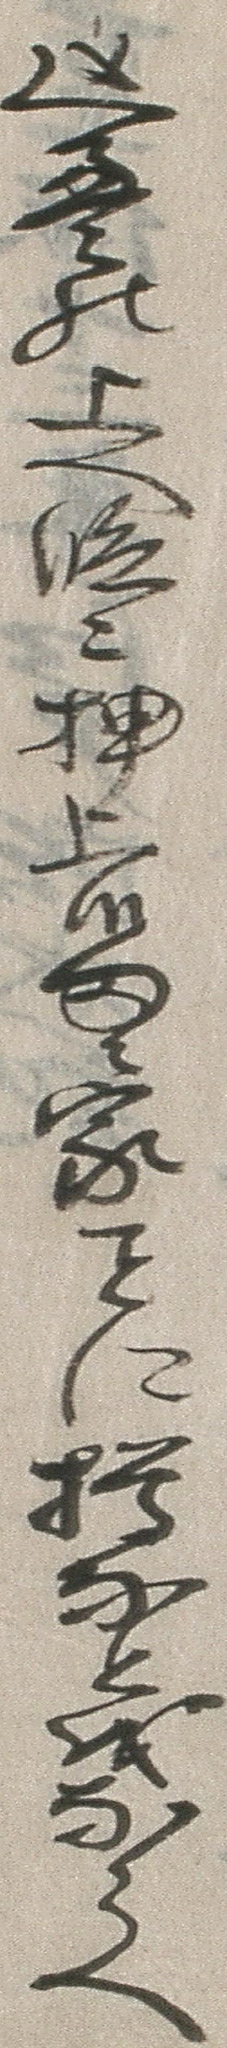込畳の上へ段々押上候まに家ことに樽なとをならへ
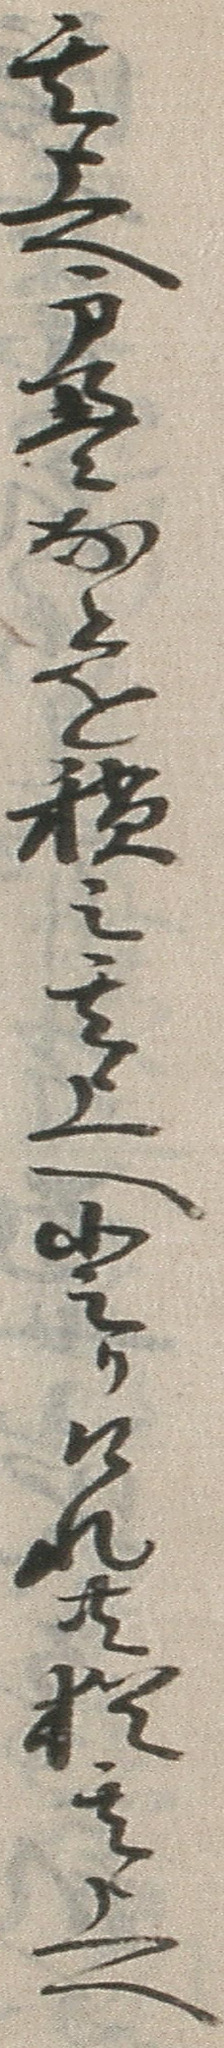其上へ戸畳なとを積み其上へ登りけれ共猶其上へ
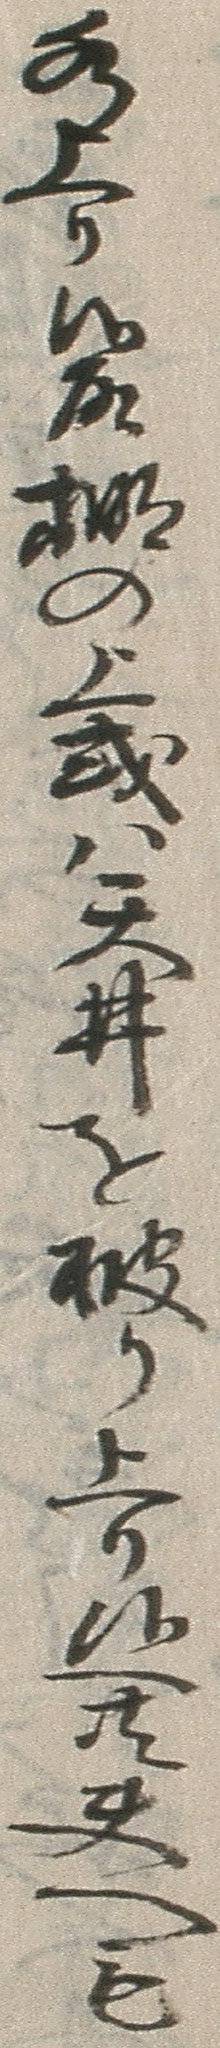水上り候故棚の上或は天井を破り上り候へ共夫へも
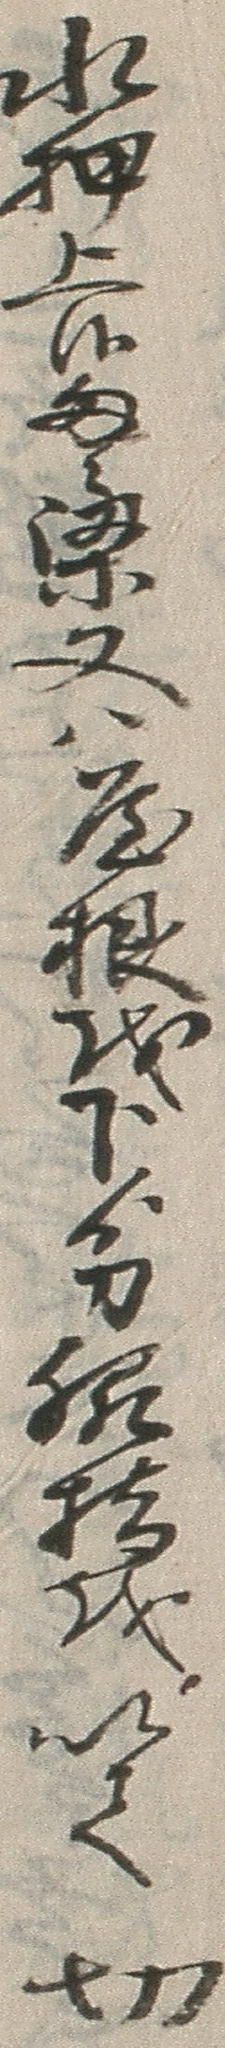水押上候まに梁又は屋根を下ゟ刀脇指を以て切
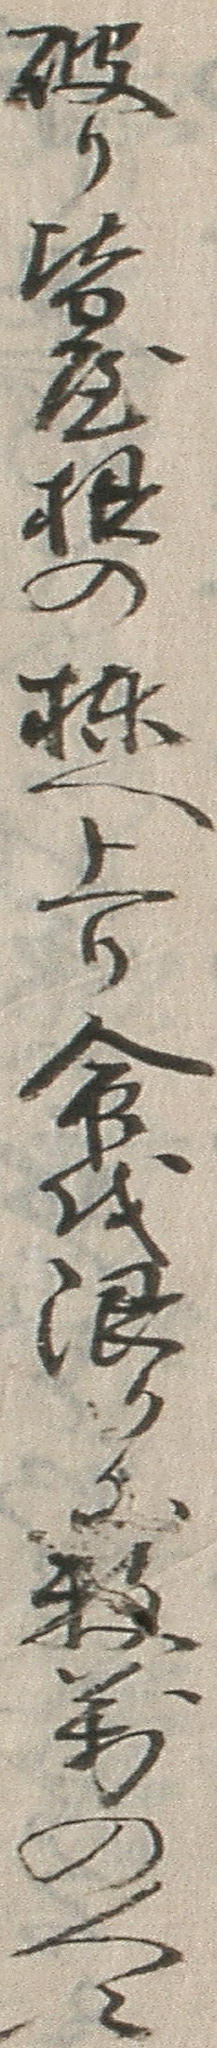破り皆屋根の棟へ上り命を限りに数万の人々
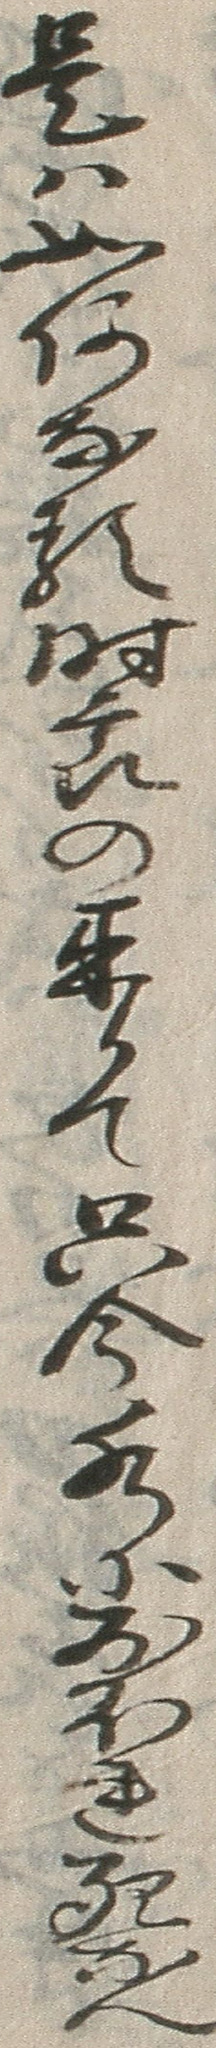是は如何なる時節の来りて只今水におほれ死なん
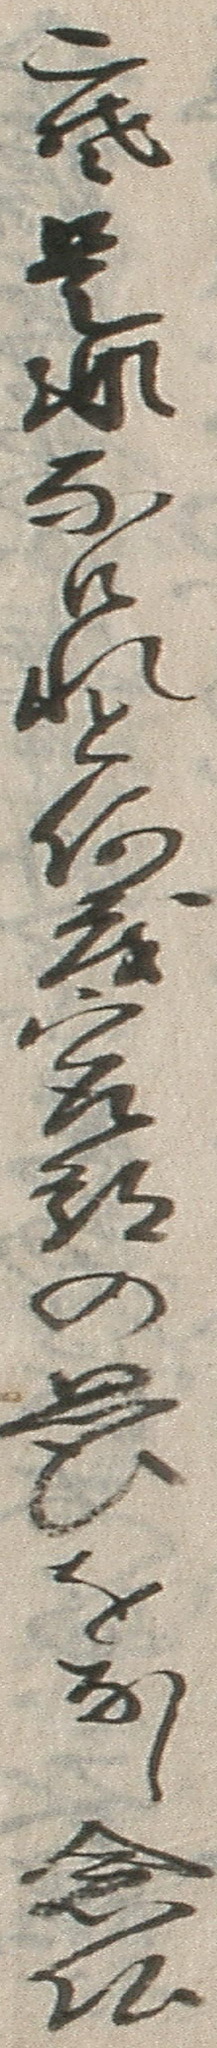こそ是非なけれと何も最期の思ひをなし念仏
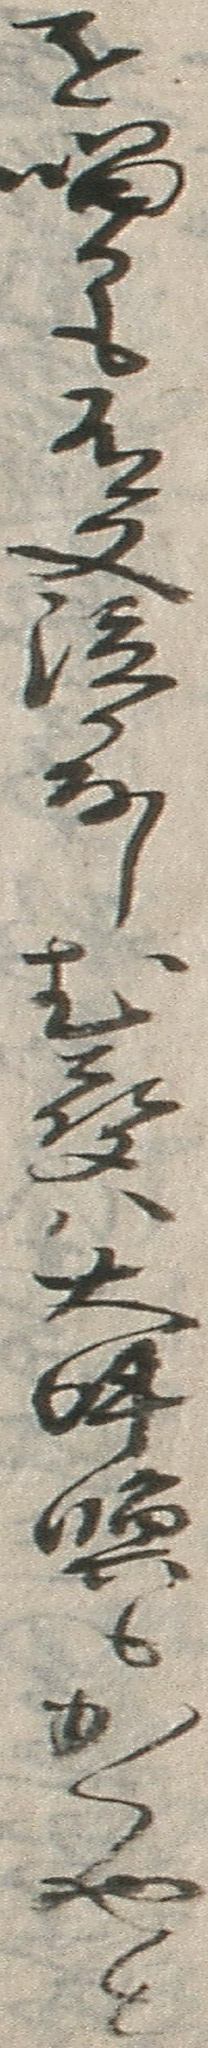を唱るも有又泣かなしむ声は大叫喚もかくやと
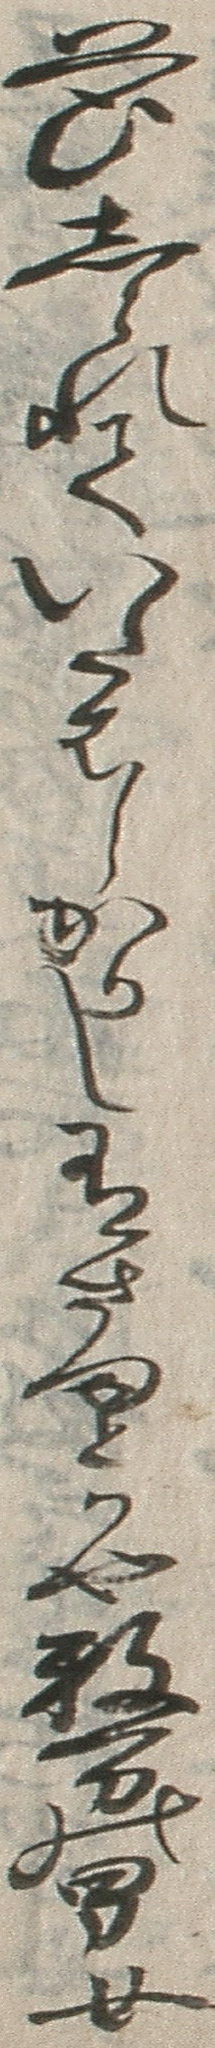思ひしれていたはしかりし有さまとかや数万の男女
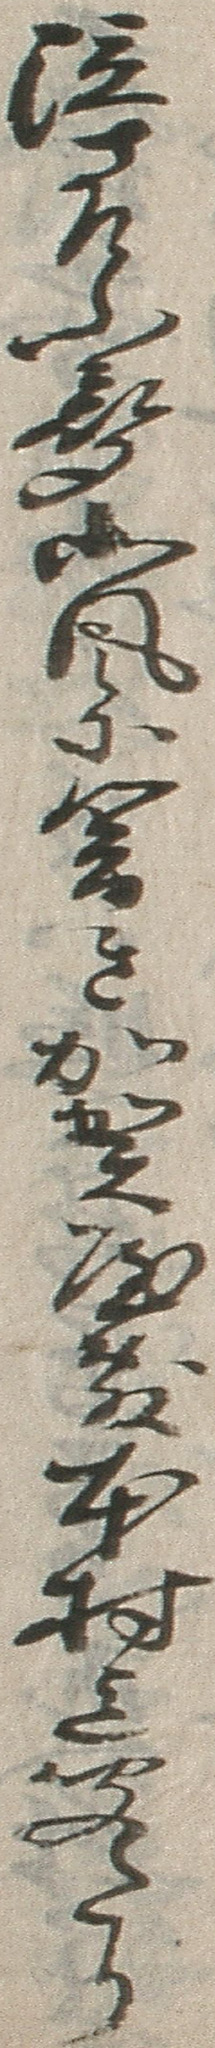泣さけふ声北風に響き加賀屋敷本村迄聞たり

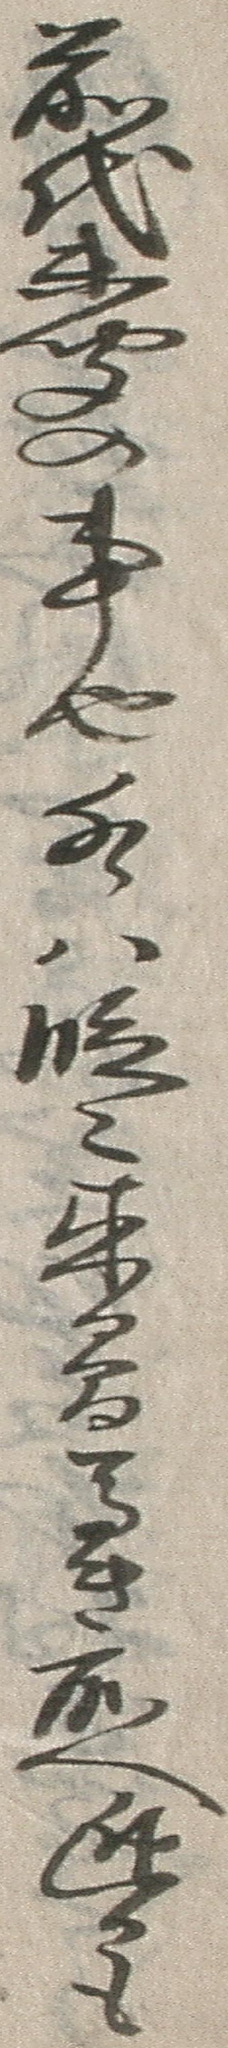前代未聞の事也水は段々来る間高き所へ逃るも
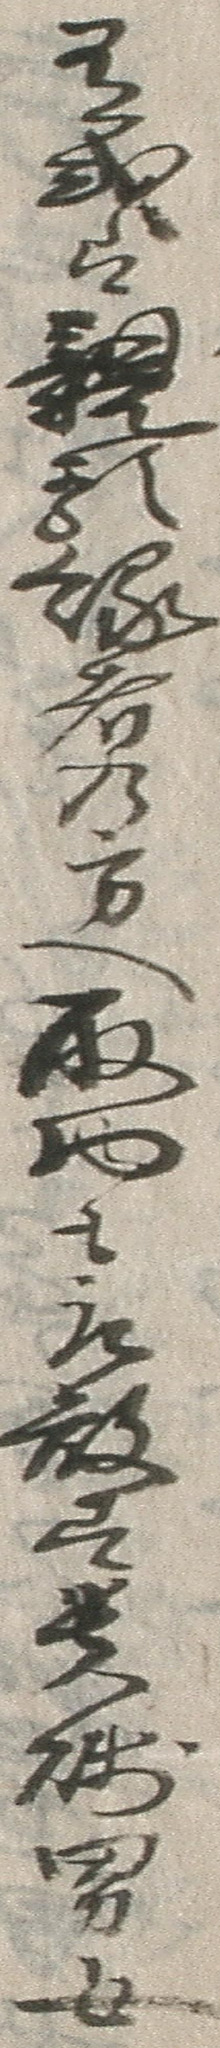有或は親類縁者の方へ取物も取敢す貴賤男女
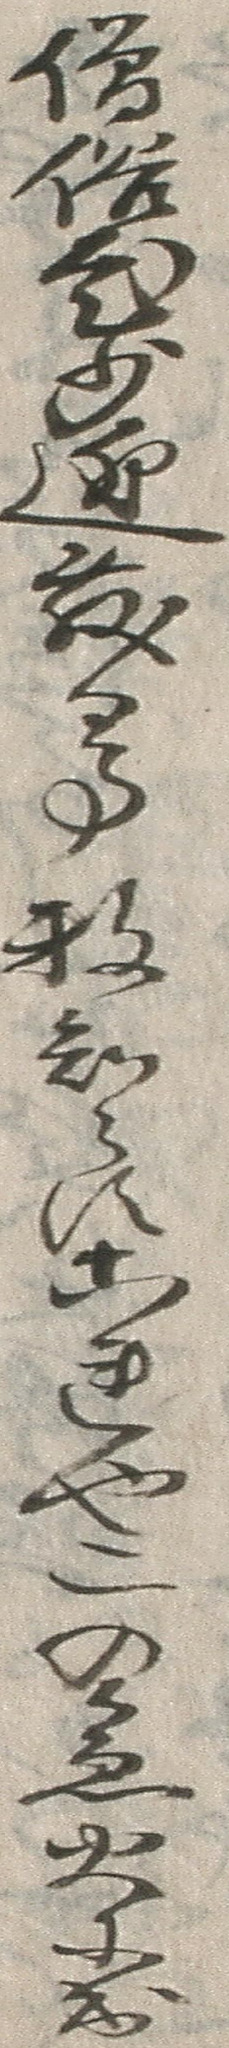僧俗老少逃散る事数知らすこれやこの急火に出
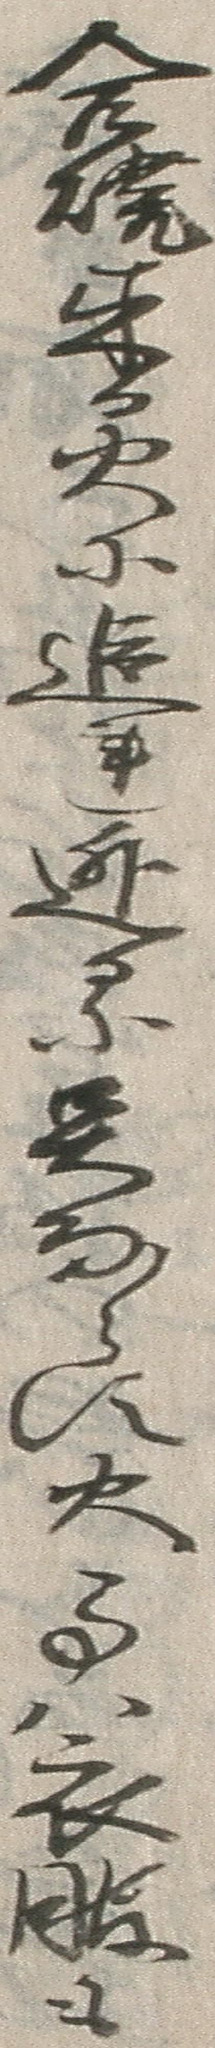合焼来る火に追れ逃るに異ならす火事は衣服も
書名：享保十三年江戸洪水記
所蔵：東京大学地震研究所図書室 Earthquake Research Institute Library, The University of Tokyo, JAPAN
